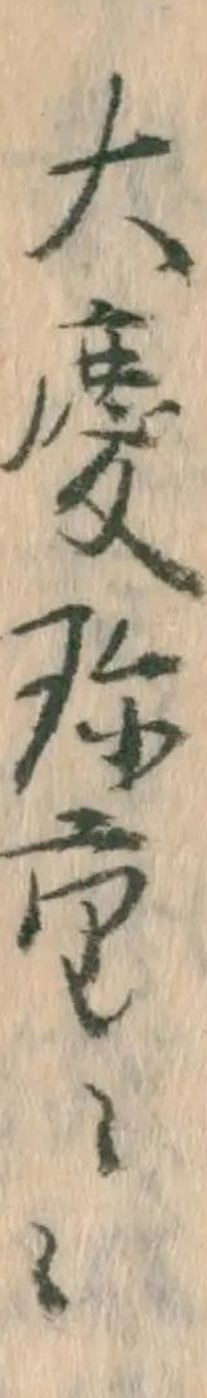大慶珍重〻〻
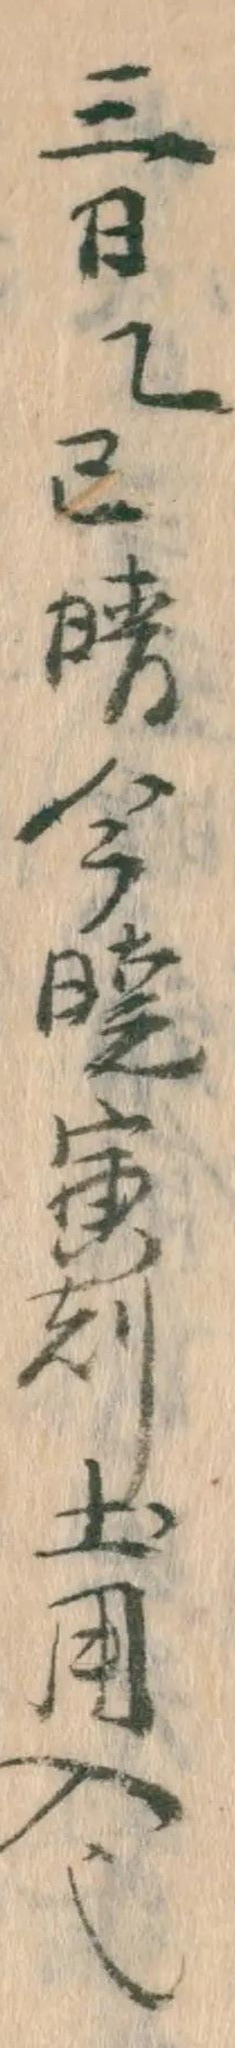三日乙巳晴今暁寅刻土用入也
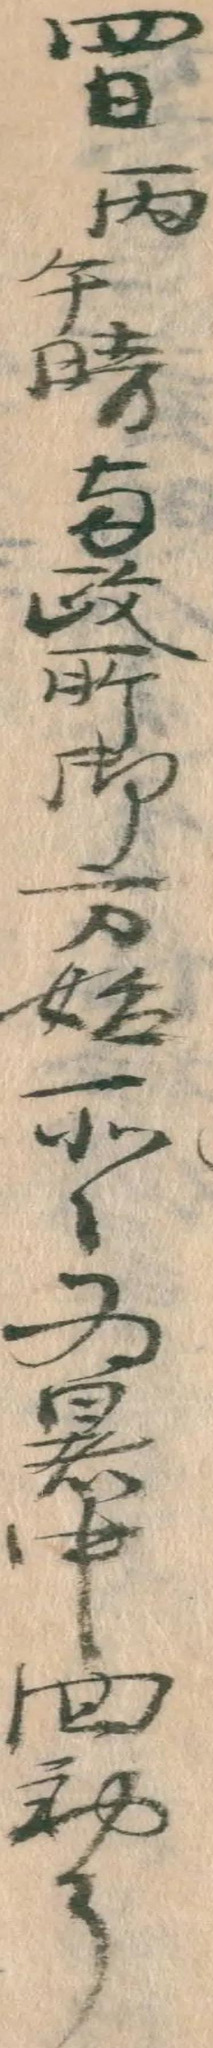四日丙午晴南政所御方始所〻為暑中回勤了
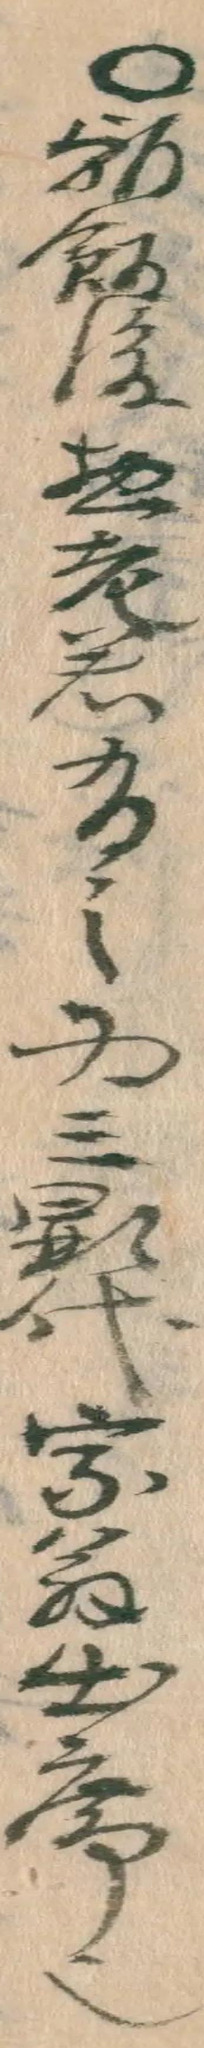○朝飯後惣老若有也為三顕代家翁出席也
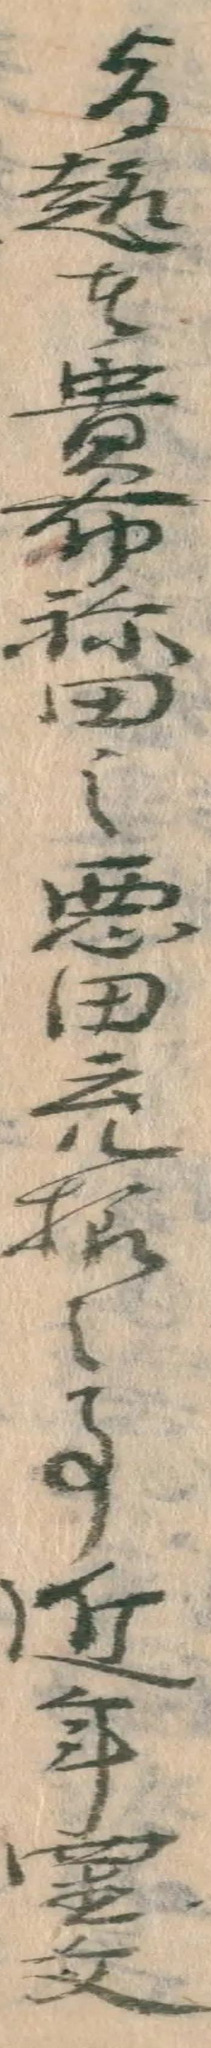旨趣者貴布祢田之悪田充様之事近年置文
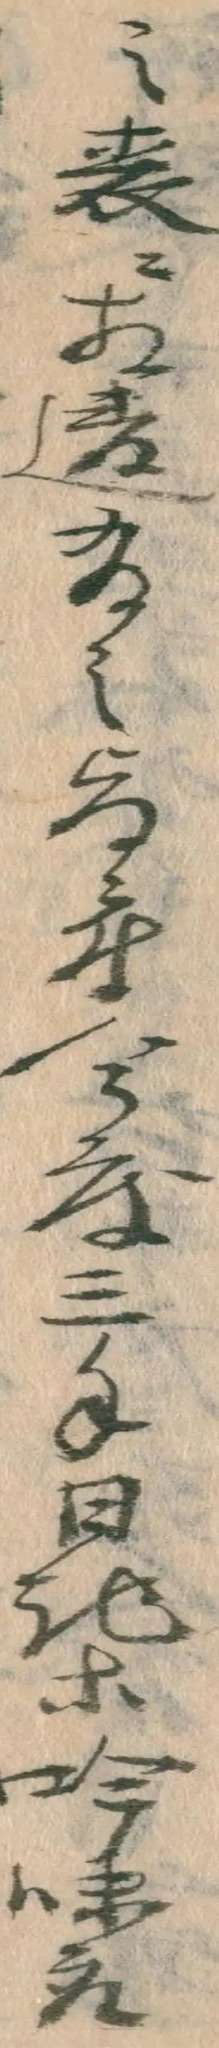之表ニ相違有之旨ニ付今度三手日記等吟味取
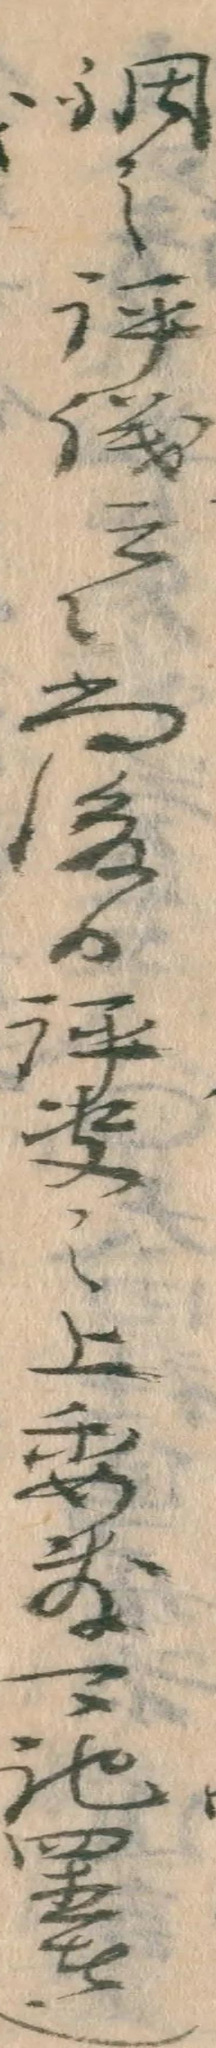調之評議云々尚後日評決之上委敷可記置者也
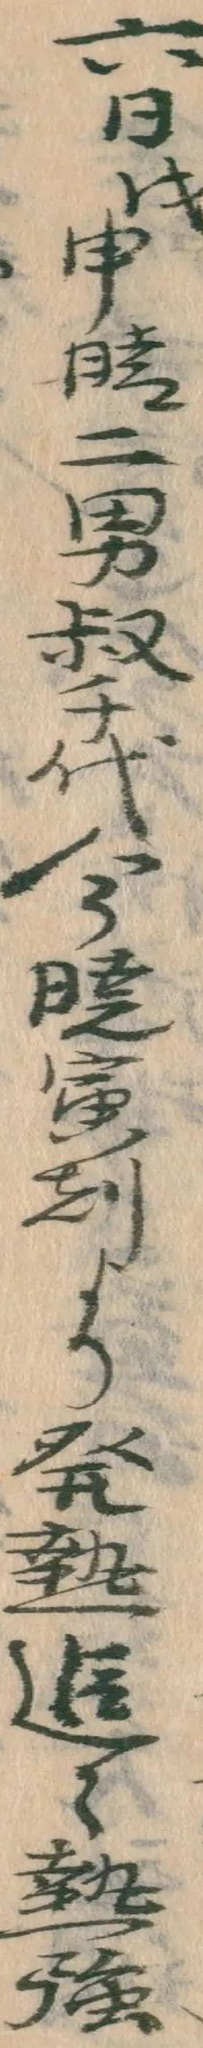六日戊申晴二男叔千代今暁寅刻より発熱追々熱強
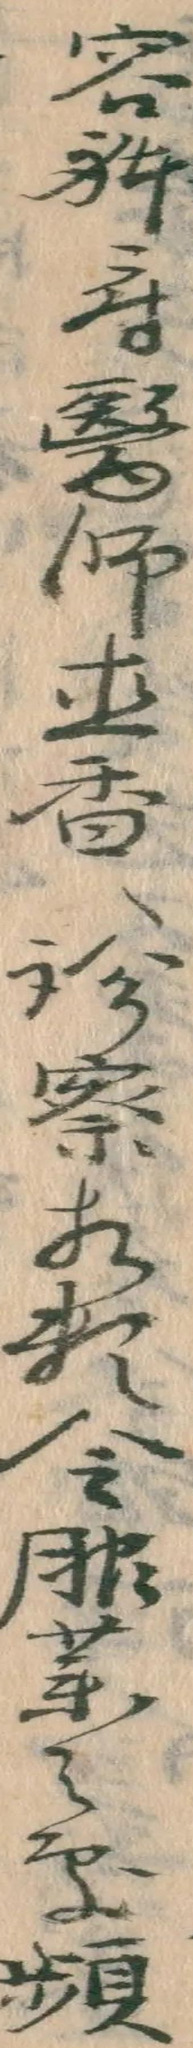容躰ニ付醫師直香へ診察相頼令服薬之處頻
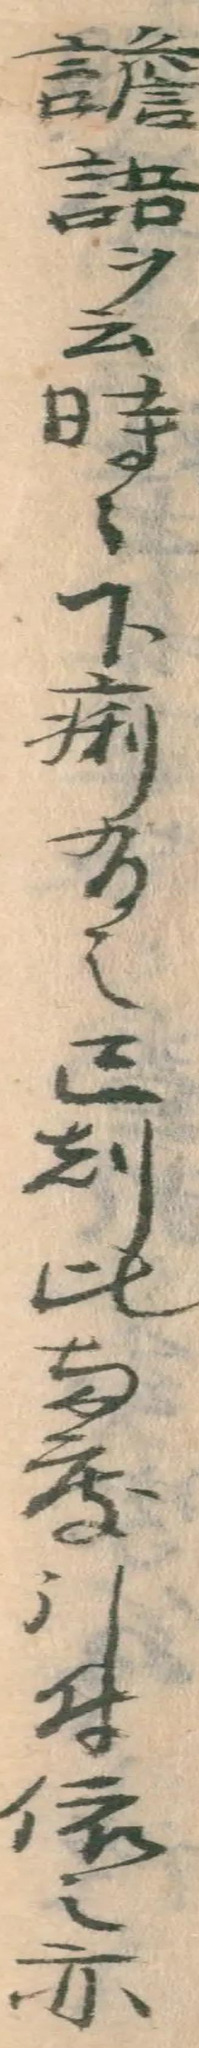譫語ヲ云時〻下痢有之巳刻比両度引付依之亦
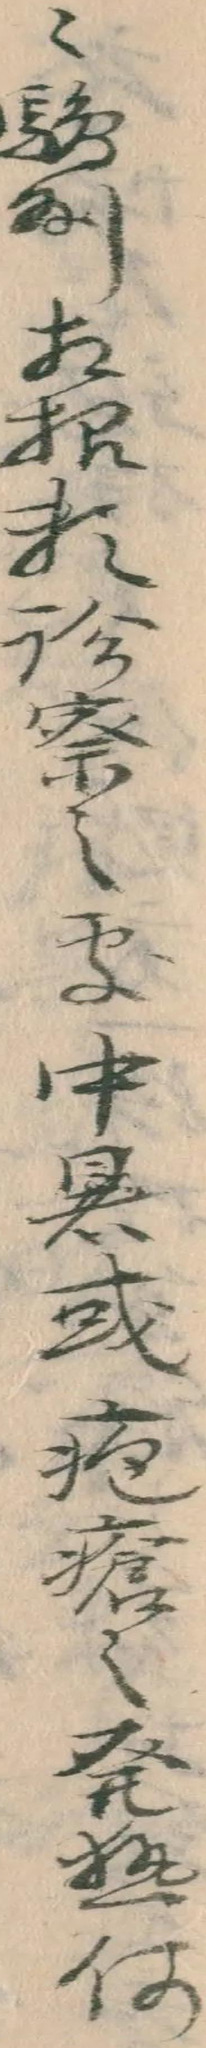々駿州相招診察之處中暑或疱瘡之発熱何
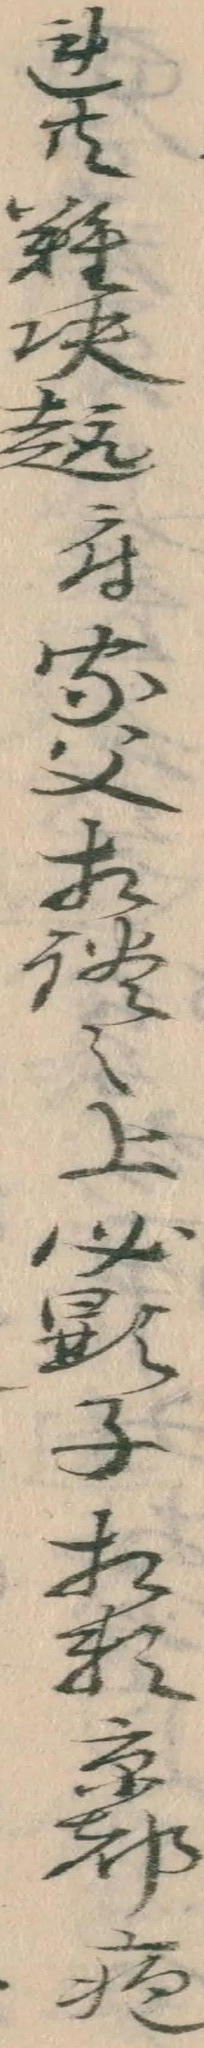れ共難決趣ニ付家父相談之上必顕子相頼京都疱
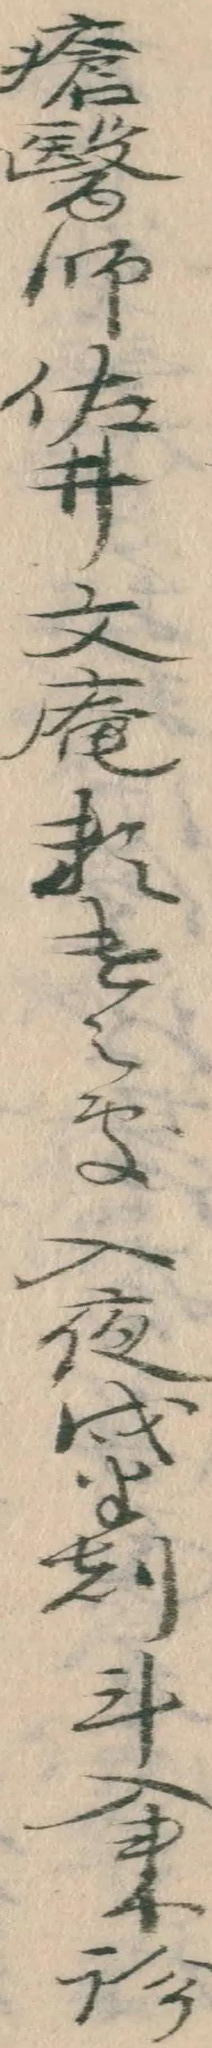瘡醫師佐井文庵頼遣之處入夜戌半刻斗入来診
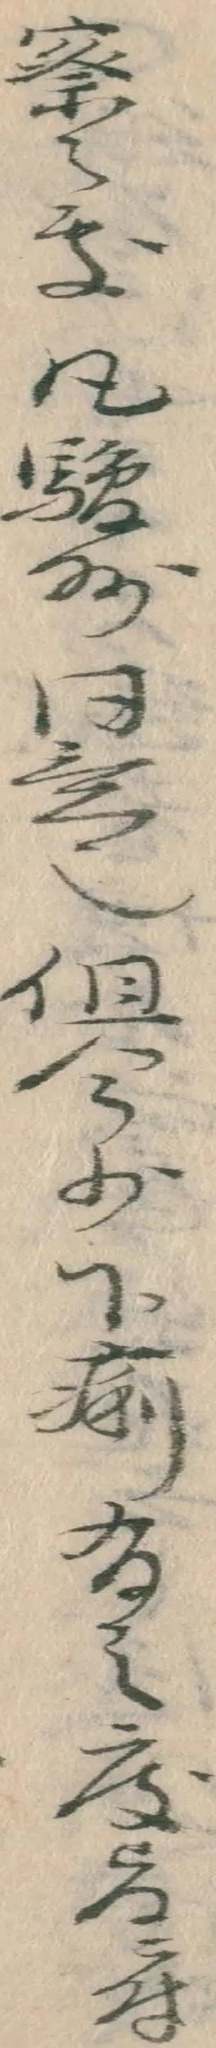察之處凡駿州同意也但今少下痢有之度旨ニ付
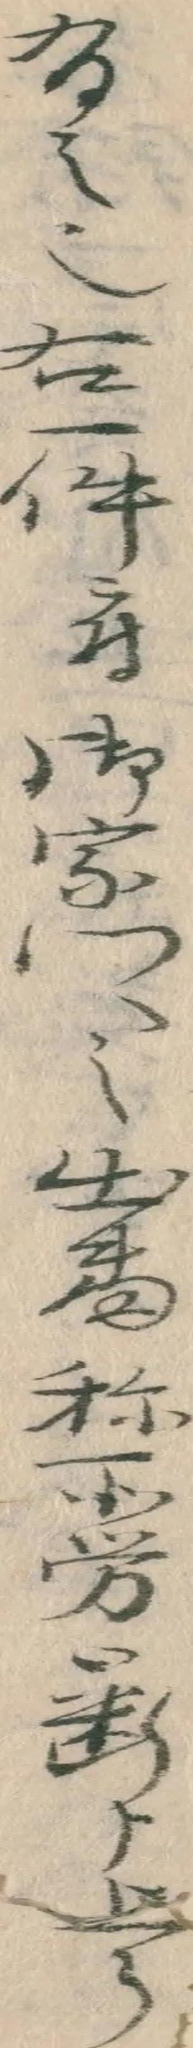有之也右一件ニ付御家門へ之出番称所労御断申上了
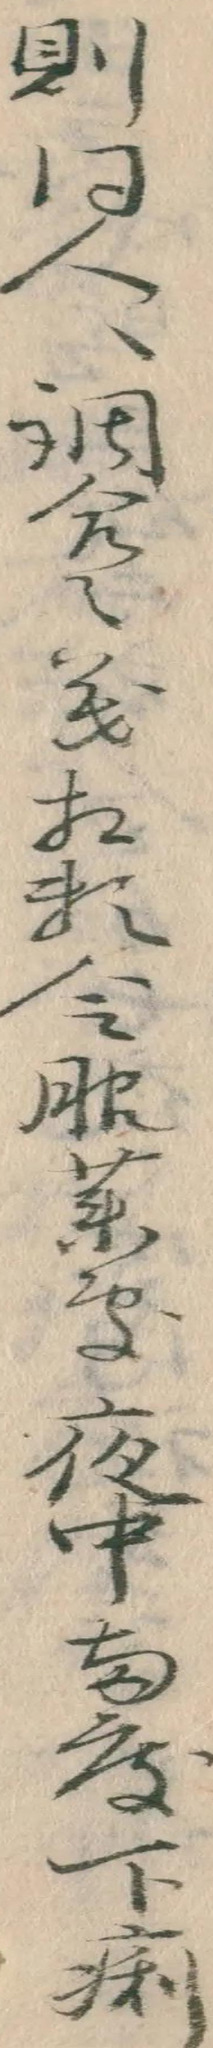則同人へ調合之義相頼令服薬處夜中両度下痢
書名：賀茂社記録. 第63冊
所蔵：国立国会図書館 National Diet Library, JAPAN
